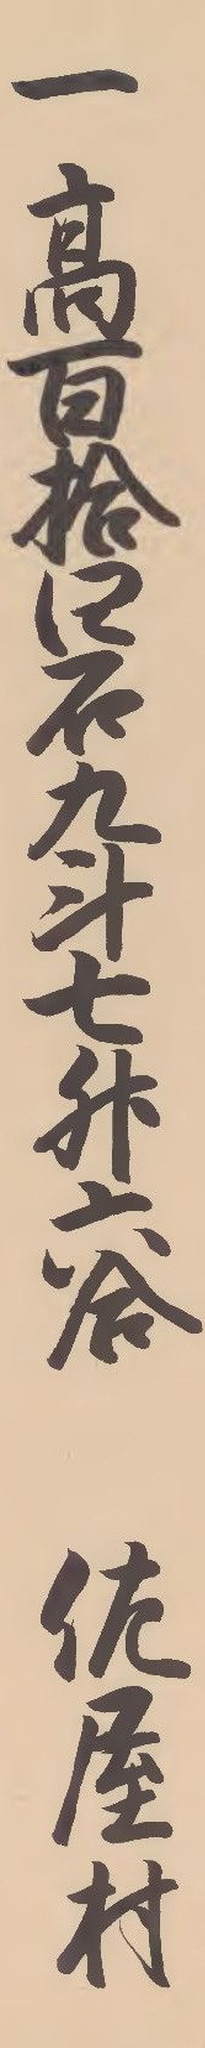一高百拾四石九斗七升六合佐屋村
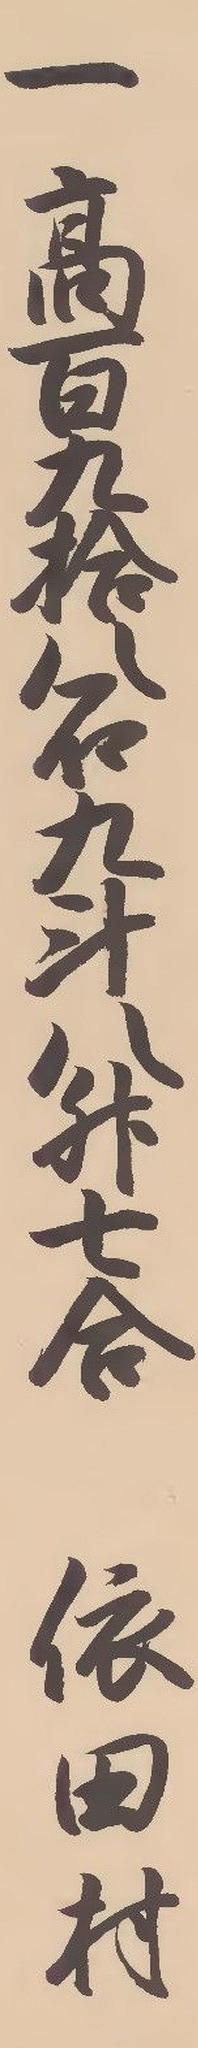一高百九拾八石九斗八升七合依田村
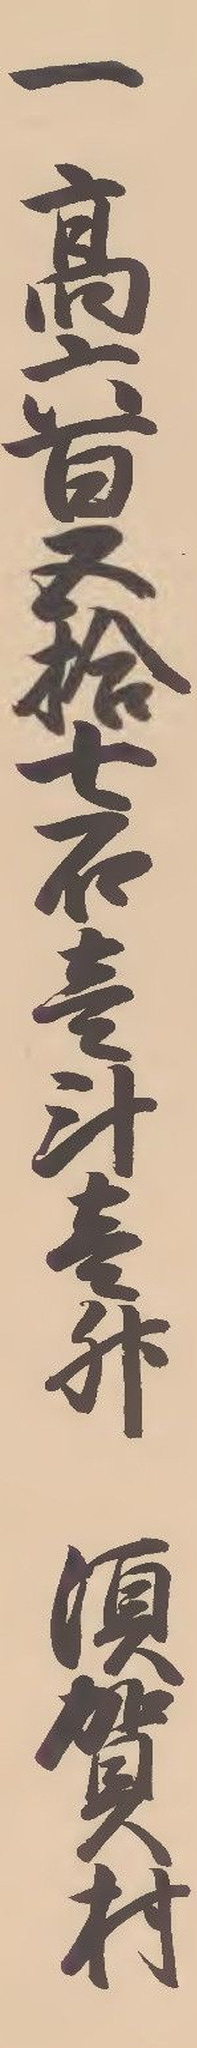一高六百五拾七石壱斗壱升須賀村

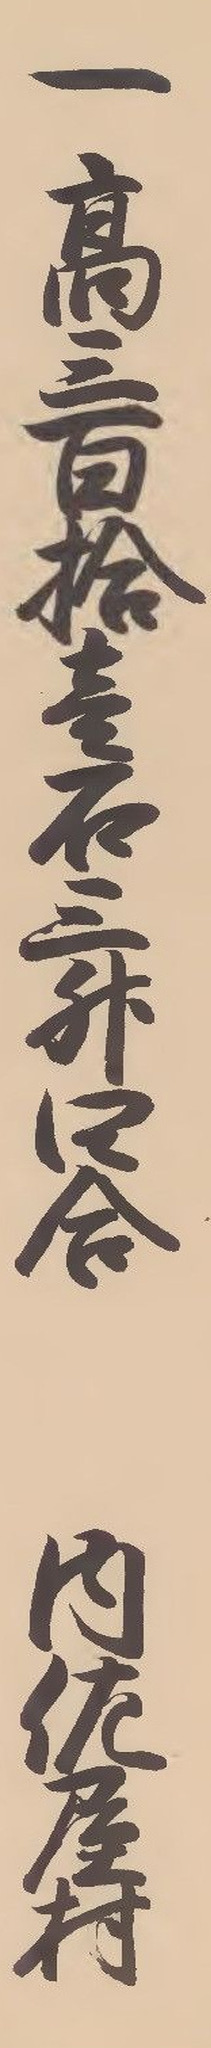一高三百拾壱石三升四合内佐屋村
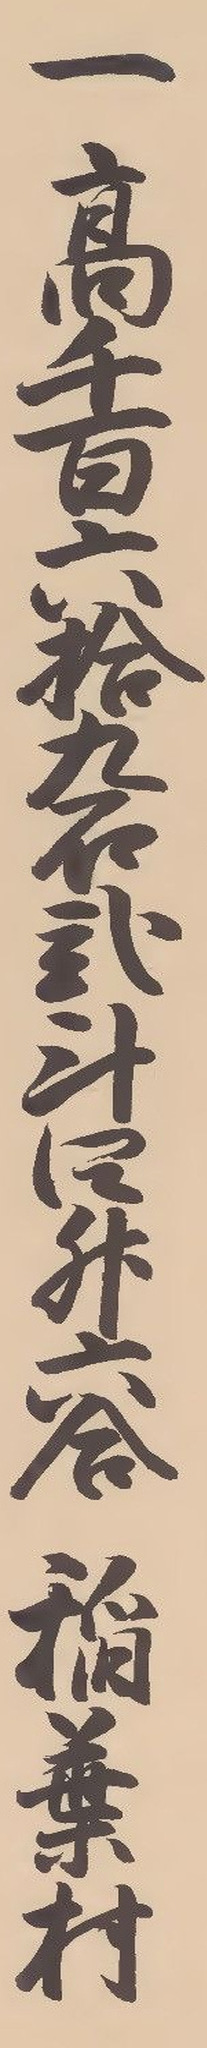一高千百六拾九石弐斗四升六合稲葉村
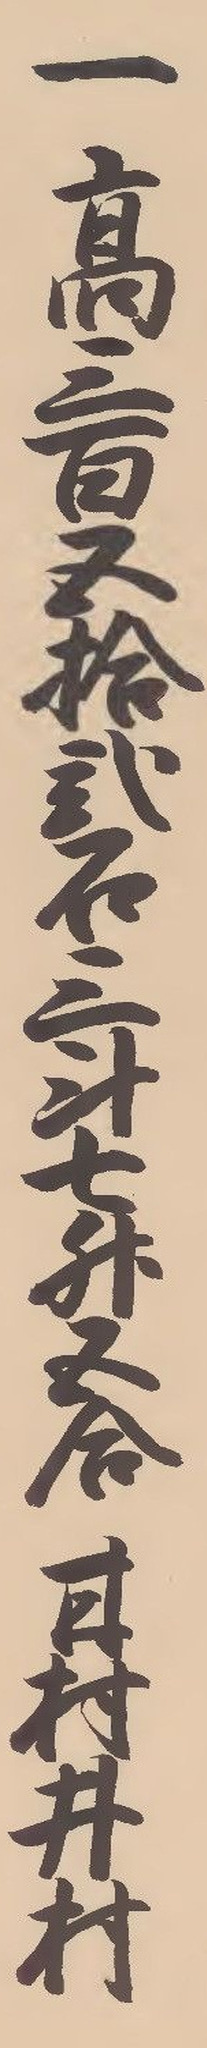一高三百五拾弐石三斗七升五合甘村井村
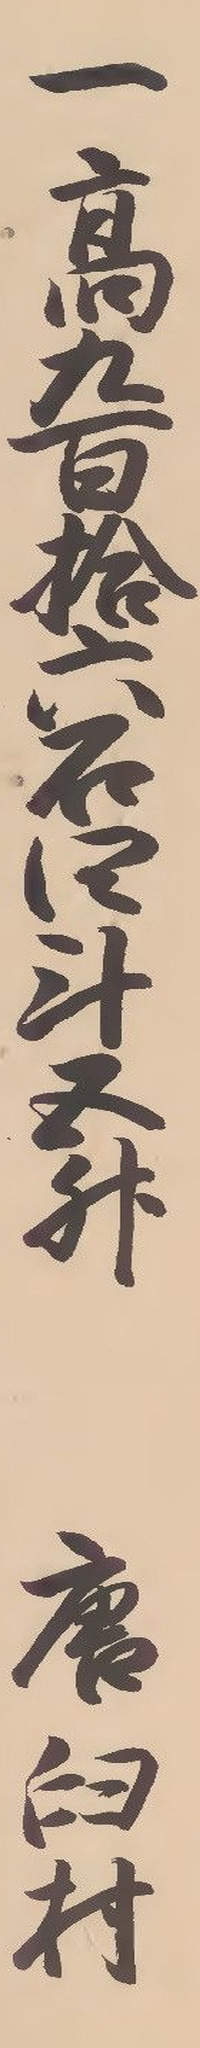一高九百拾六石四斗五升唐臼村
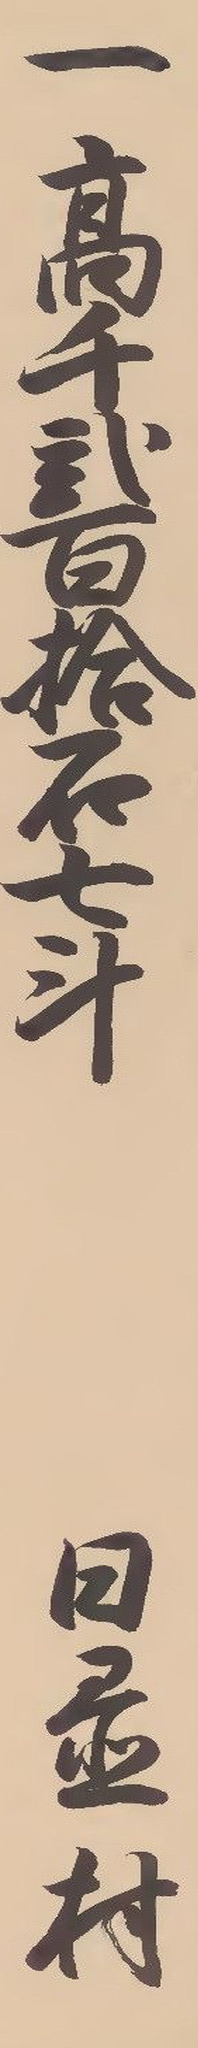一高千弐百拾石七斗日置村
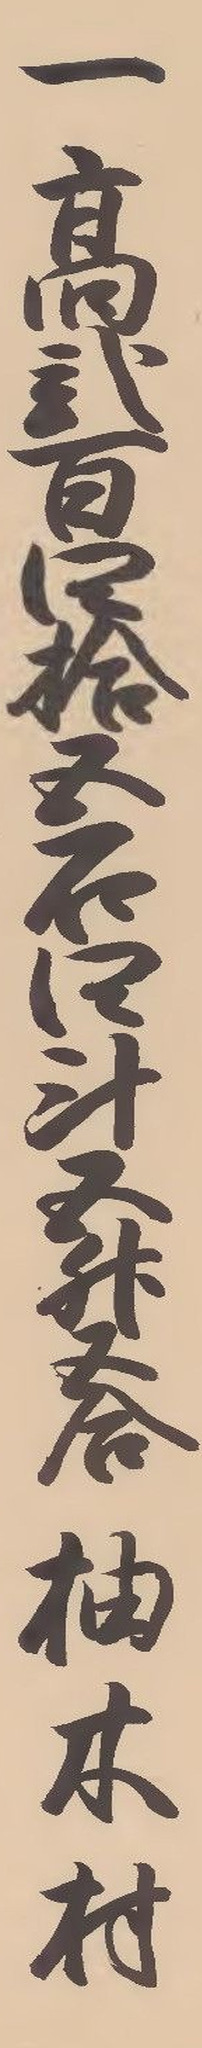一高弐百四拾五石四斗五升五合柚木村
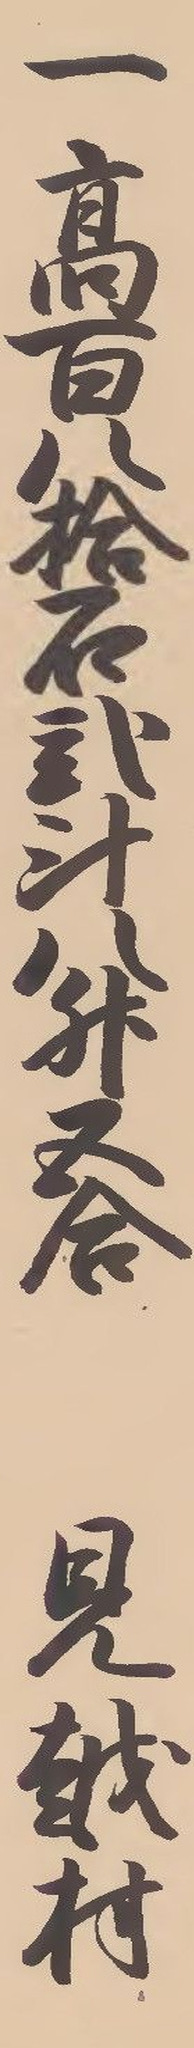一高百八拾石弐斗八升五合見越村

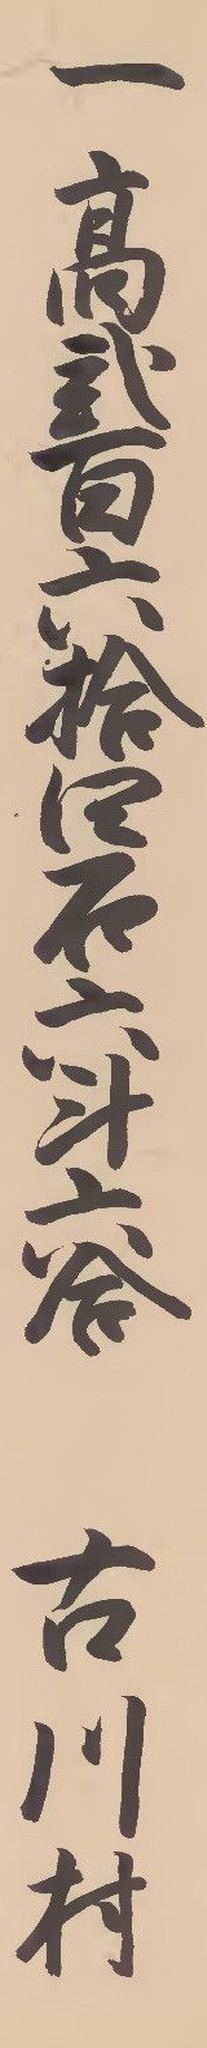一高弐百六拾四石六斗六合古川村
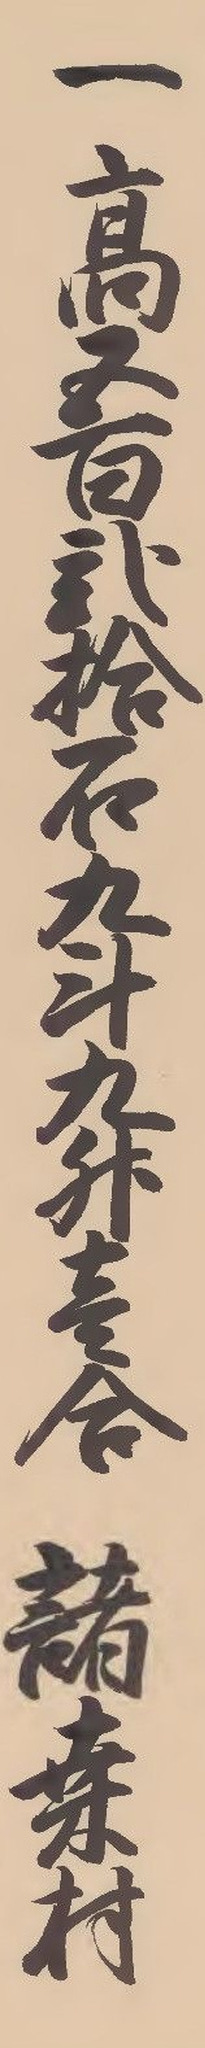一高五百弐拾石九斗九升壱合諸桑村
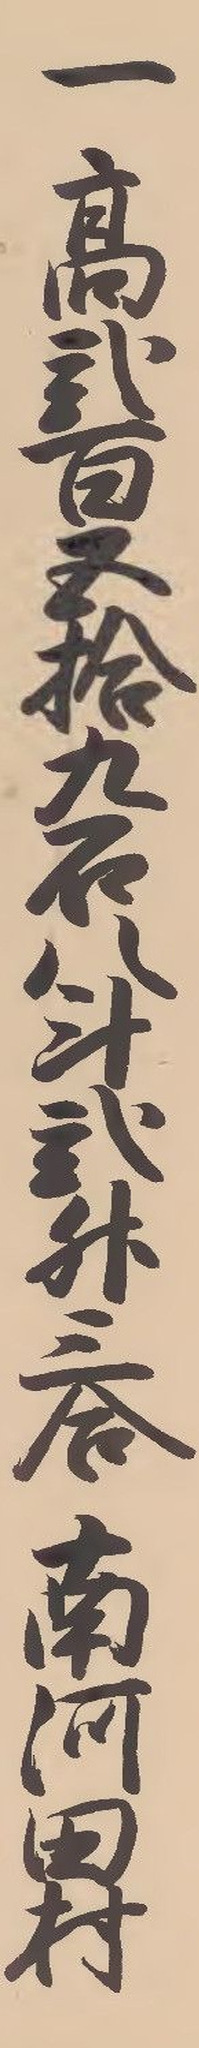一高弐百五拾九石八斗弐升三合南河田村
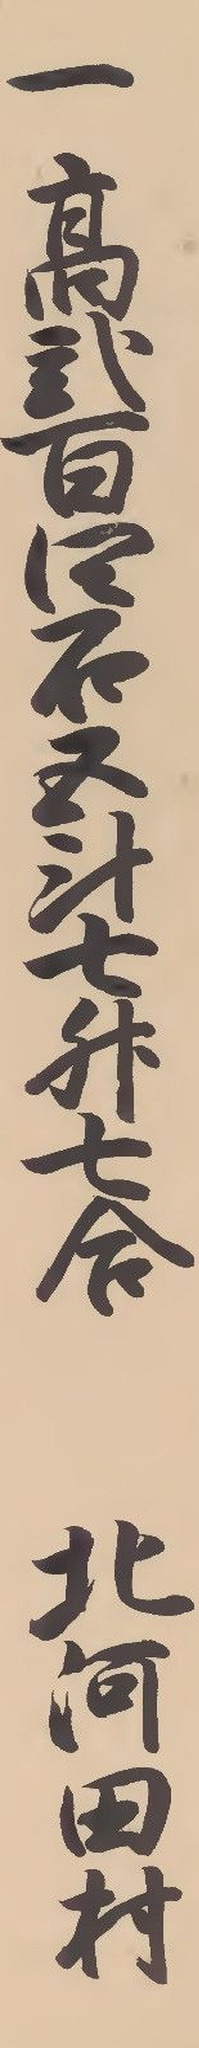一高弐百四石五斗七升七合北河田村
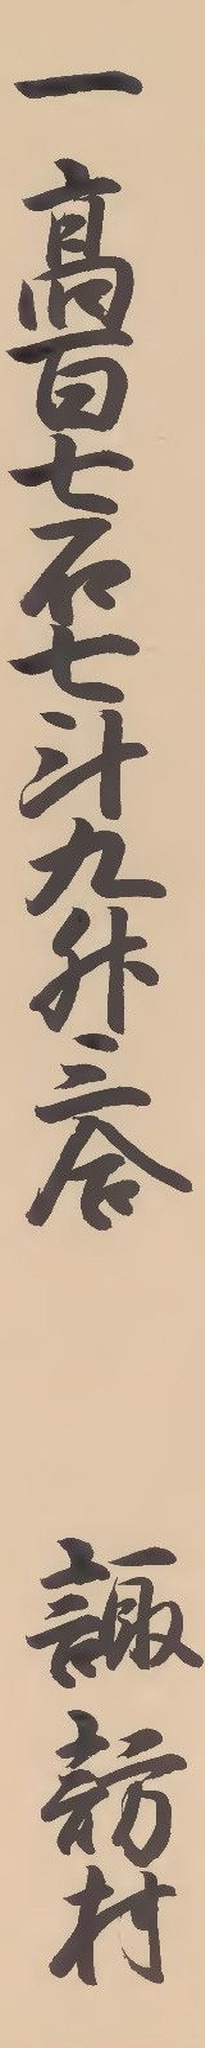一高百七石七斗九升三合諏訪村
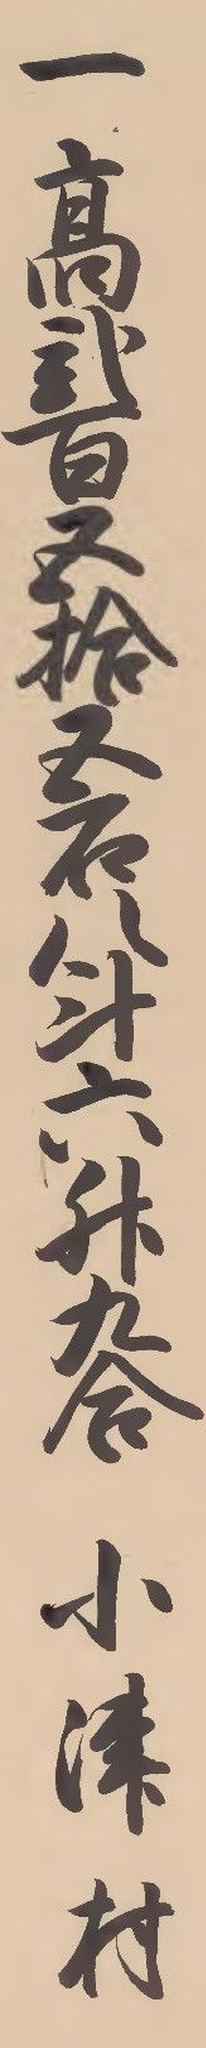一高弐百五拾五石八斗六升九合小津村
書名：尾張国郷帳
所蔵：国立公文書館 National Archives of Japan
